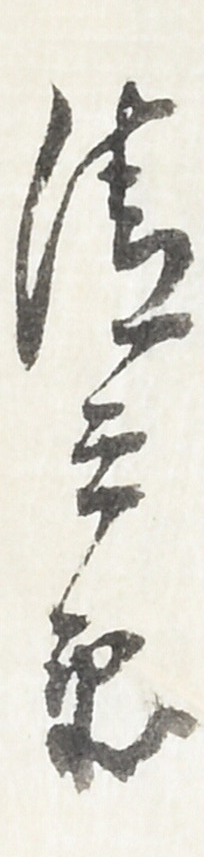清兵衛
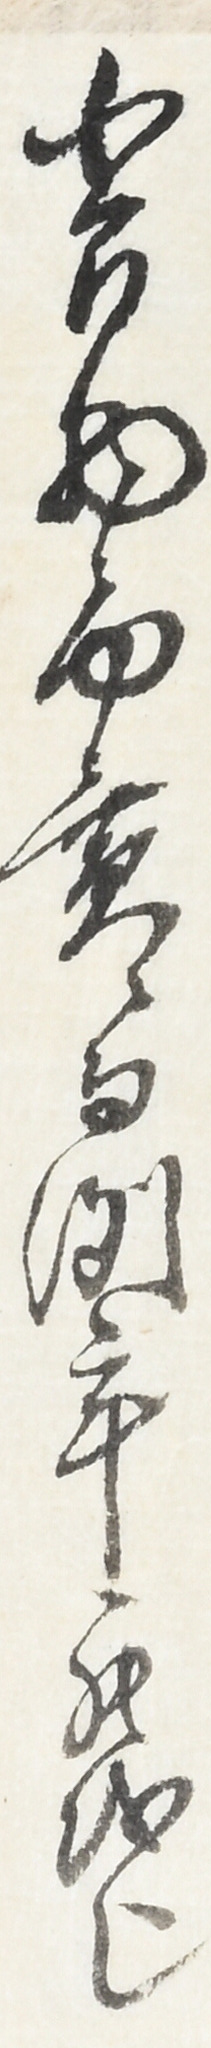小間物商売ニ而例年罷越申候

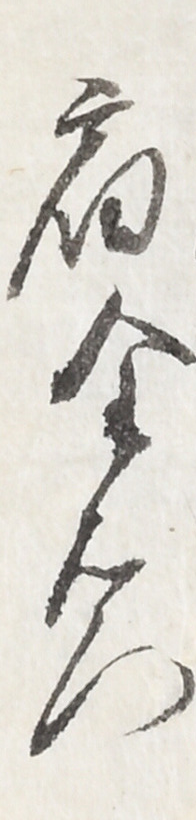宿金右衛門
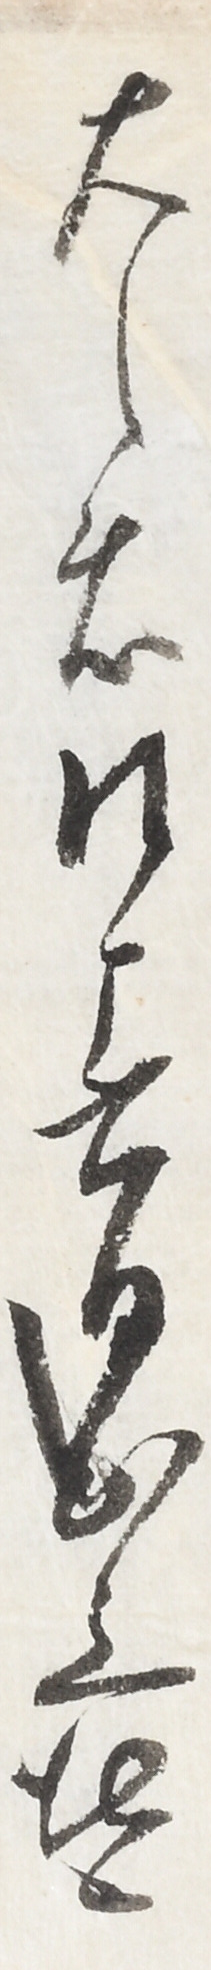右之者同十六日出立仕候
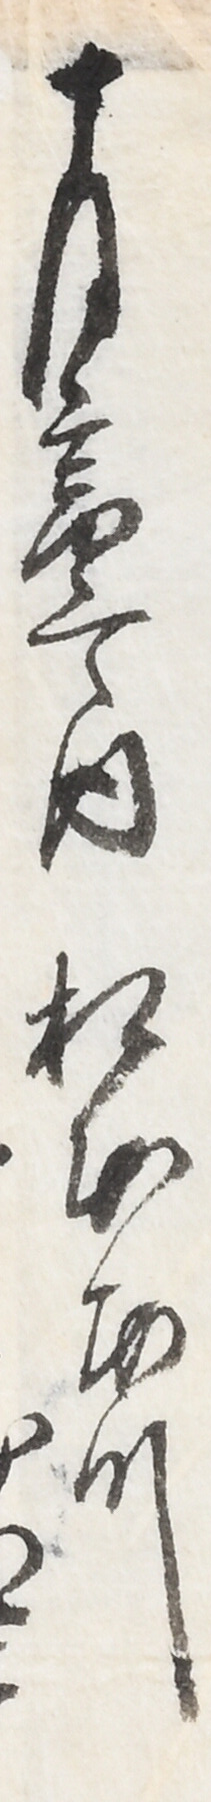十月書上之内松本本町
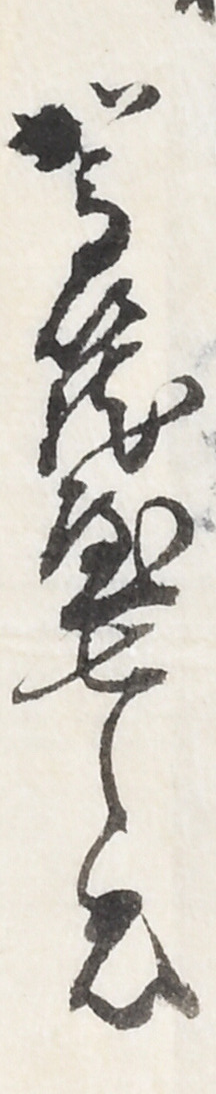一駕籠屋七之丞
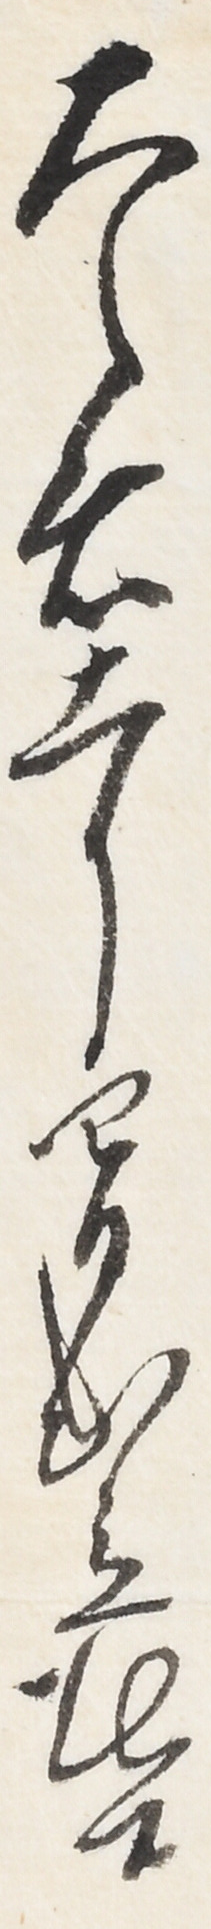右之者十一月四日出立仕候
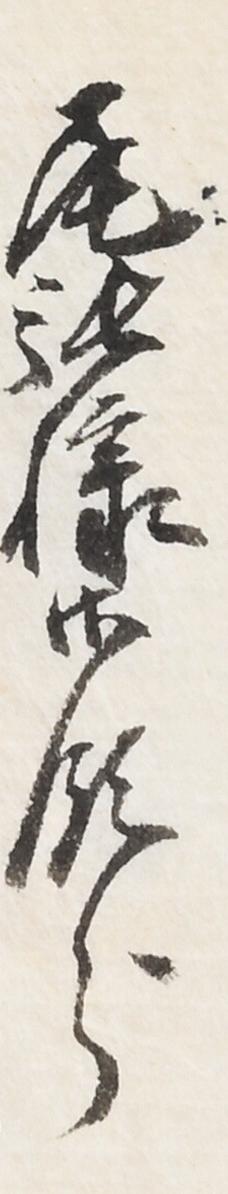尾張様御領分
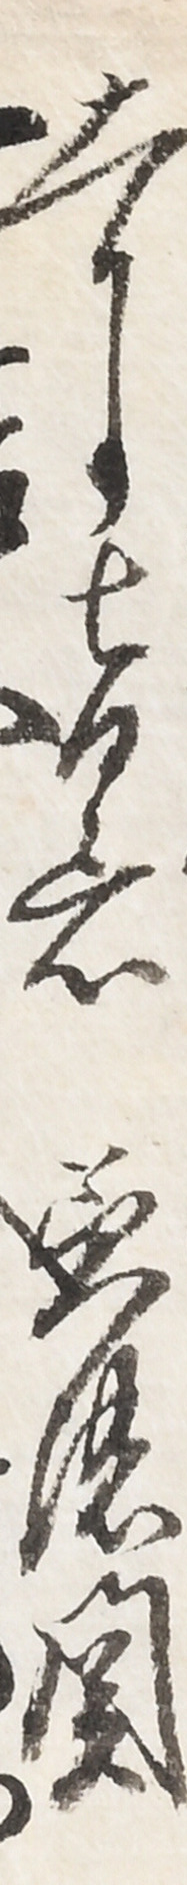十一月七日着美濃関
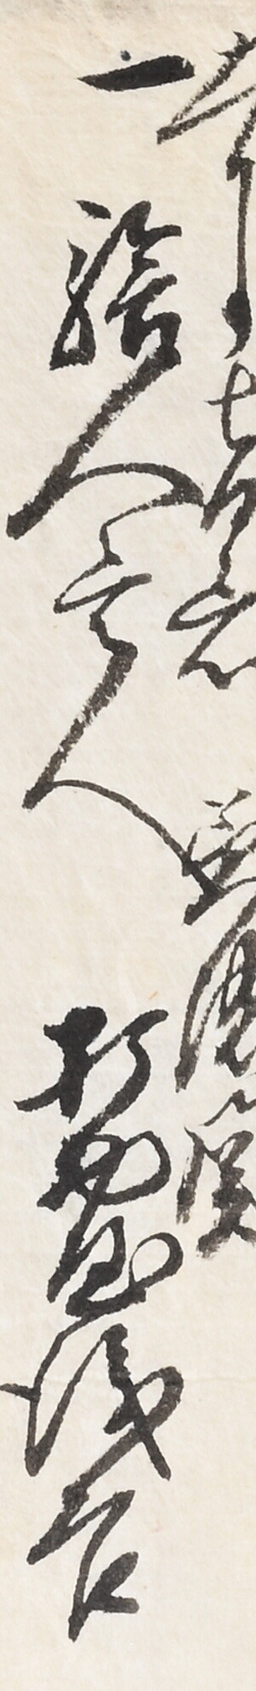一旅人壱人打物屋儀吉
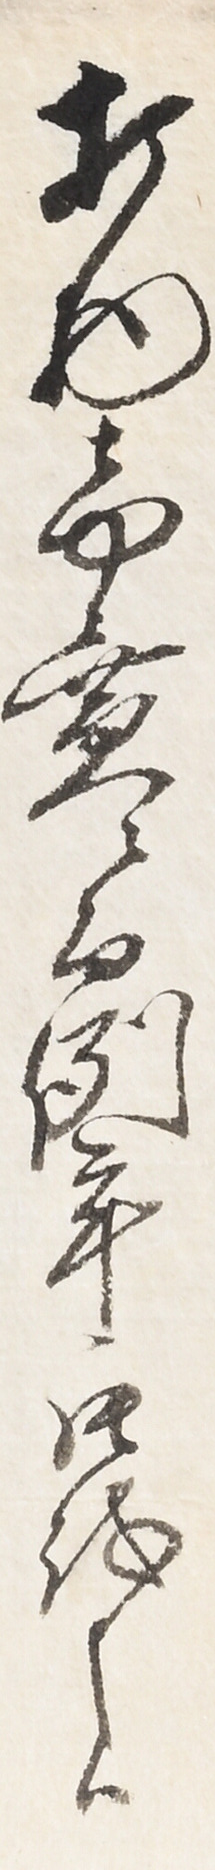打物商売ニ而例年罷越申候
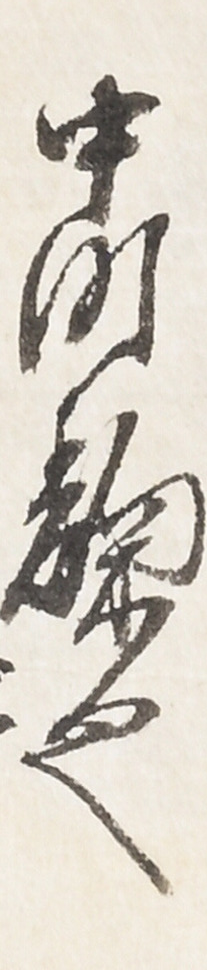中町麹や
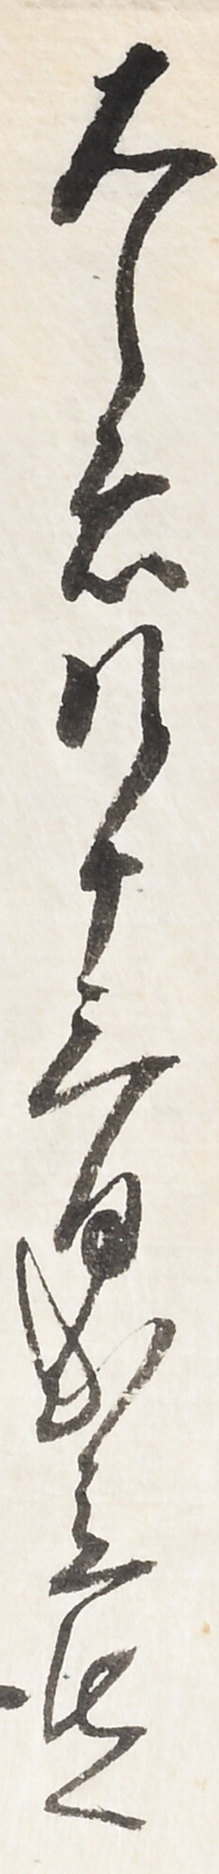右之者同十三日出立仕候
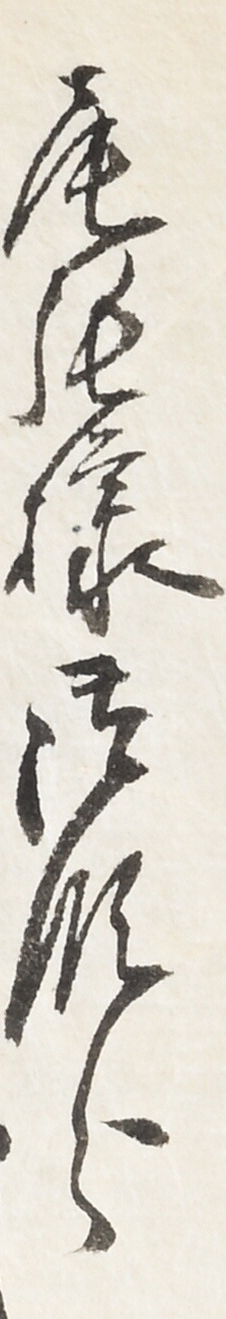尾張様御領分
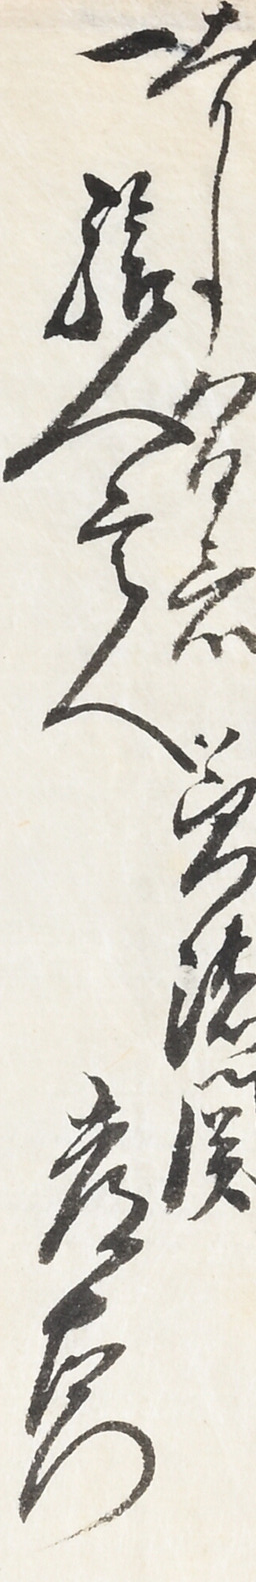一旅人壱人常右衛門
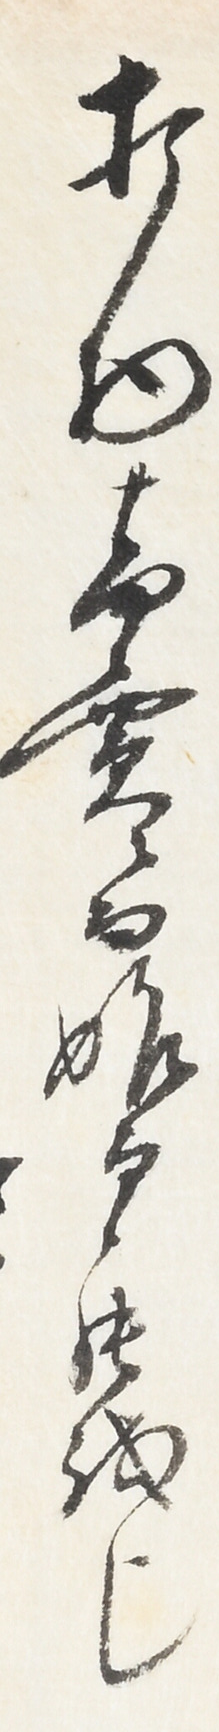打物商売ニ而始而罷越申候
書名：旅人泊控帳
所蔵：伊那市立高遠町図書館・合同会社AMANE
